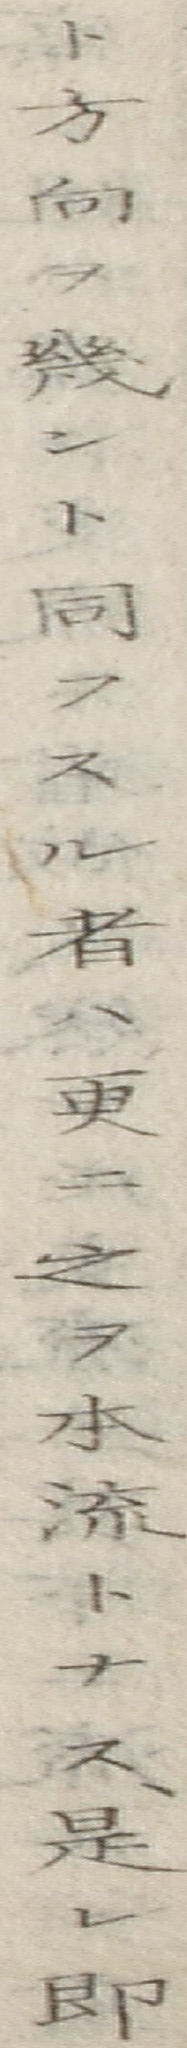ト方向ヲ幾ント同フスル者ハ更ニ之ヲ本流トナス、是レ即
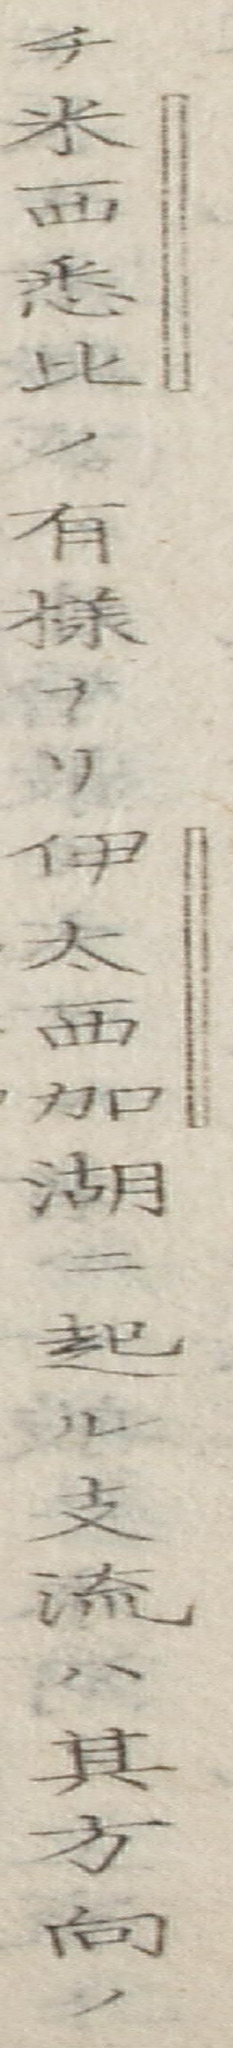チ米西悉比ノ有様ナリ伊太西加湖ニ起ル支流ハ其方向ノ
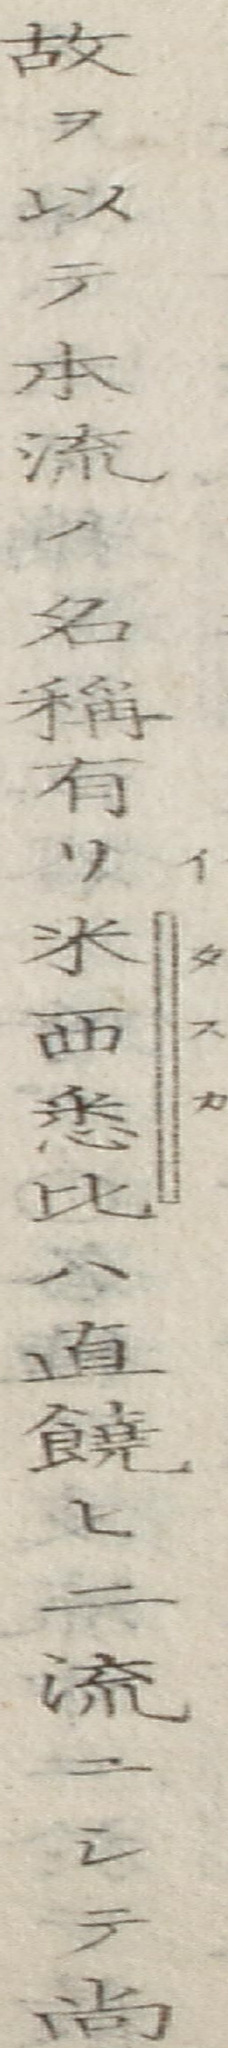故ヲ以テ本流ノ名称リ米西悉比ハ直饒ヒ二流ニシテ尚
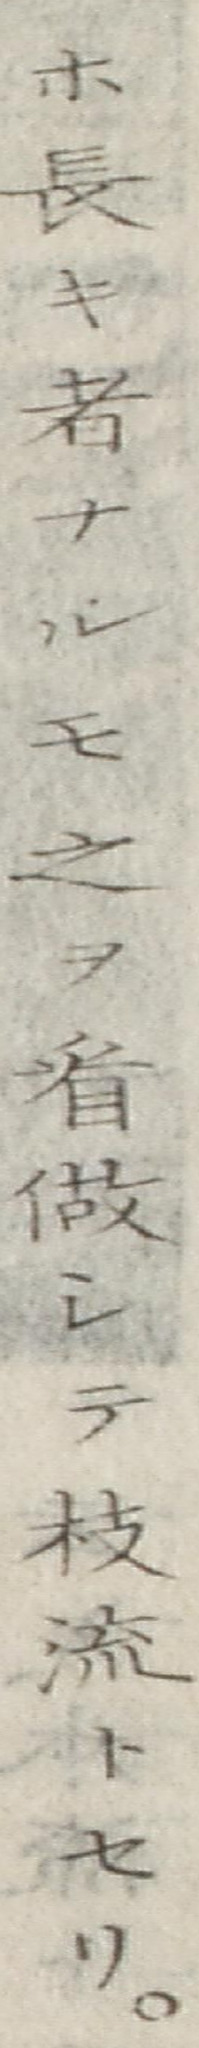ホ長キ者ナルモ之ヲ看做シテ枝流トセリ。
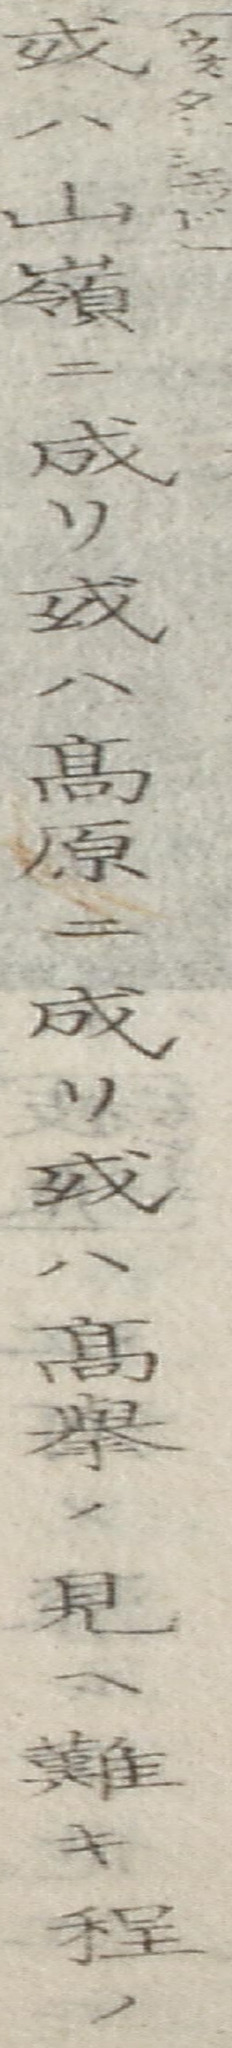或ハ山嶺ニ成リ或ハ高原ニ成リ或ハ高挙ノ見ヘ難キ程ノ
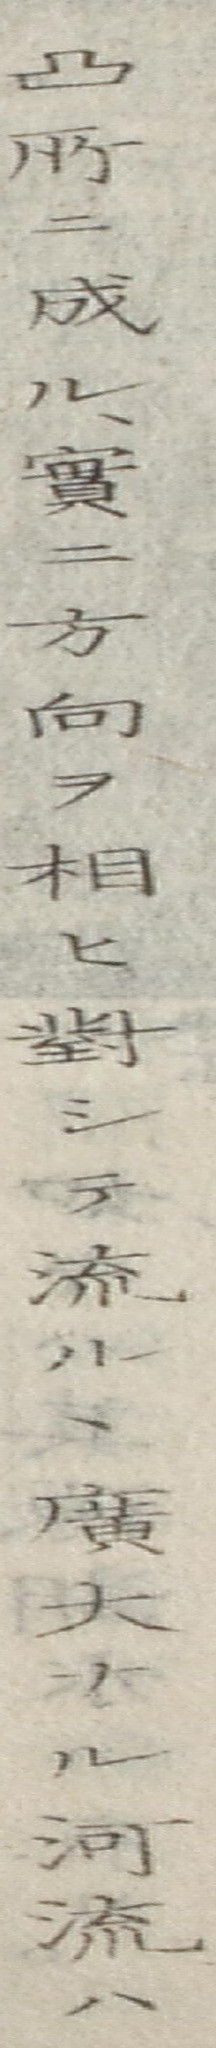凸所ニ成ル、実ニ方向ヲ相ヒ対シテ流ルヽ広大ナル河流ハ
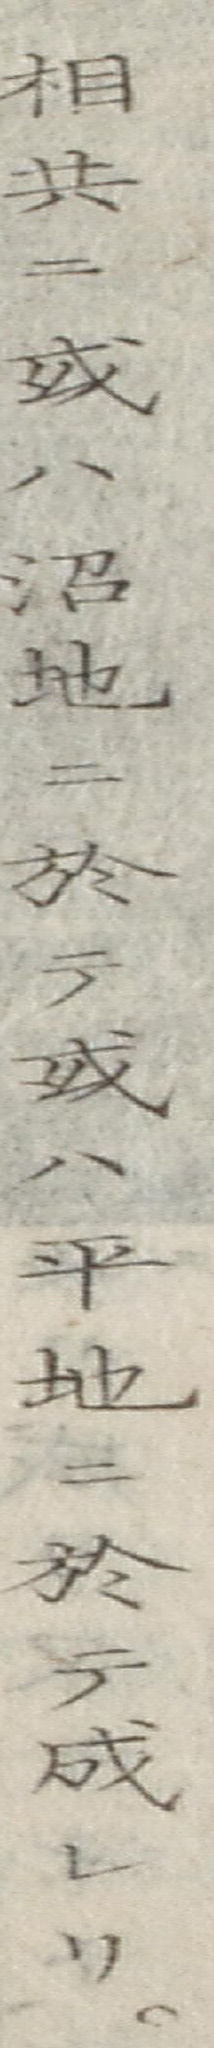相共ニ或ハ沼地ニ於テ或ハ平地ニ於テ成レリ。
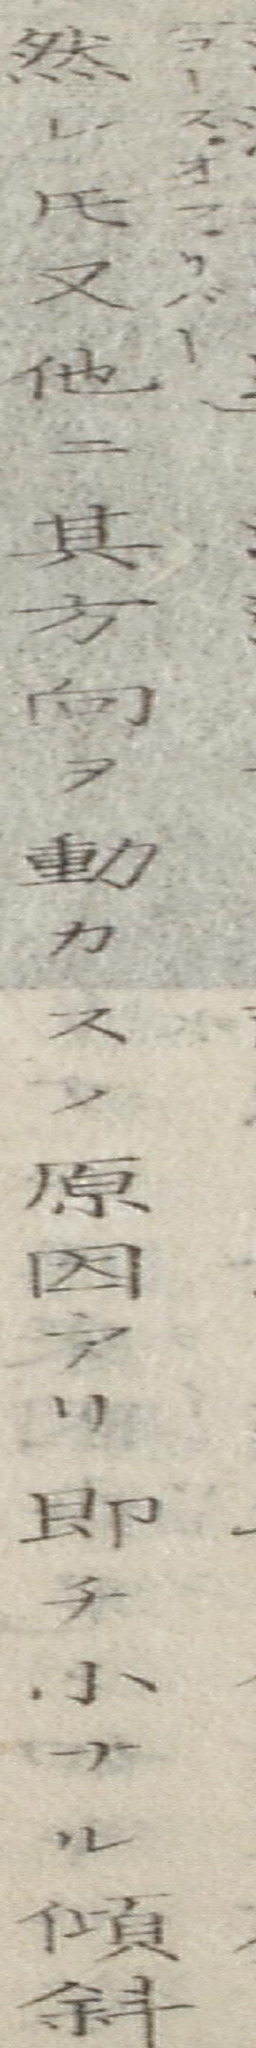然レトモ又他ニ其方向ヲ動カスノ原因アリ即チ小ナル傾斜
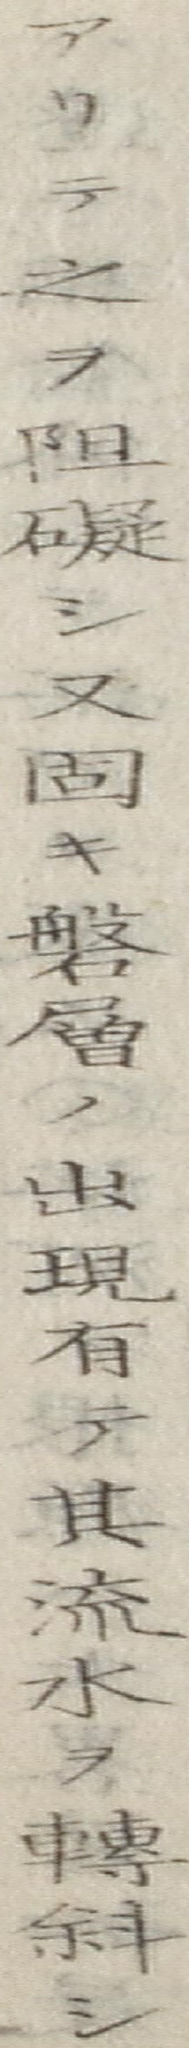アリテ之ヲ阻礙シ又固キ盤層ノ出現有テ其流水ヲ転斜シ
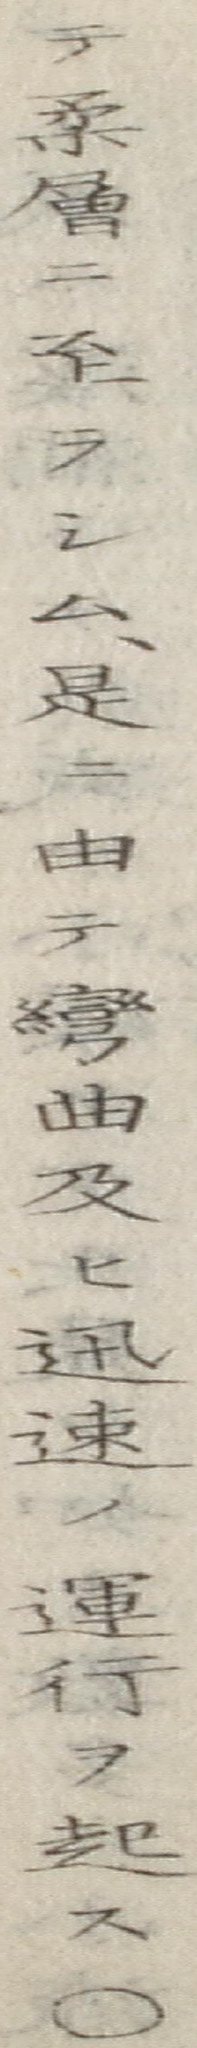テ柔層ニ至ラシム、是ニ由テ湾曲及ヒ迅速ノ運行ヲ起ス〇
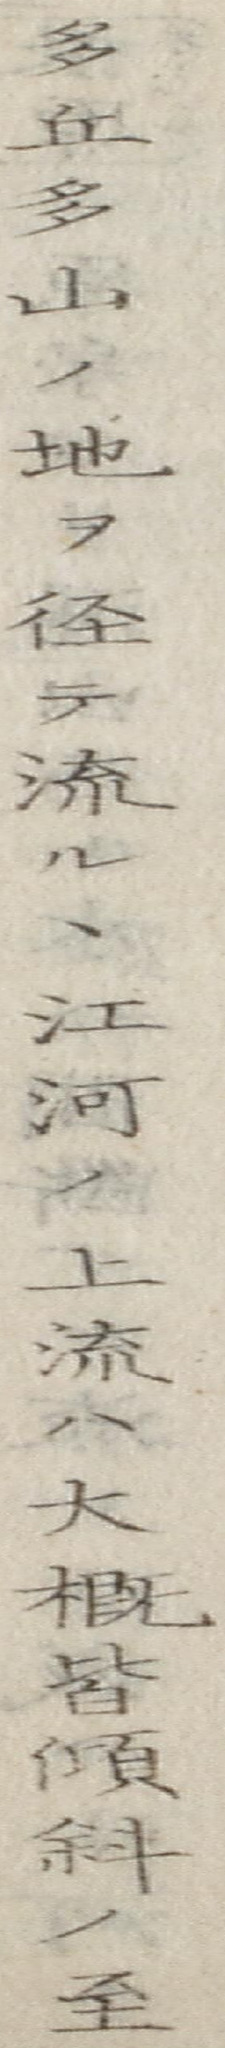多丘多山ノ地ヲ径テ流ルヽ江河ノ上流ハ大概皆傾斜ノ至
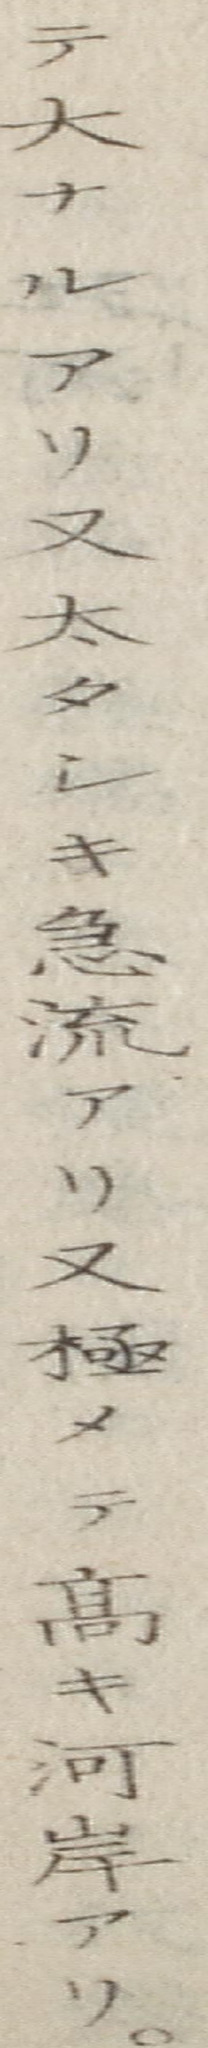テ大ナルアリ又太タシキ急流アリ又極メテ高キ河岸アリ。
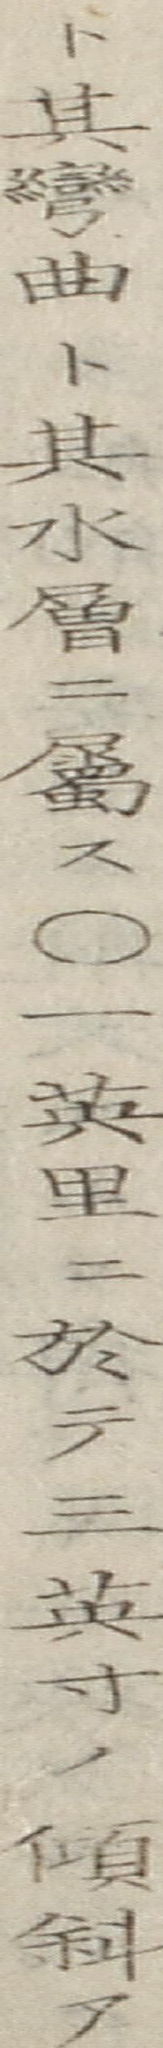ト其湾曲ト其水層ニ属ス〇一英里ニ於テ三英寸ノ傾斜ア
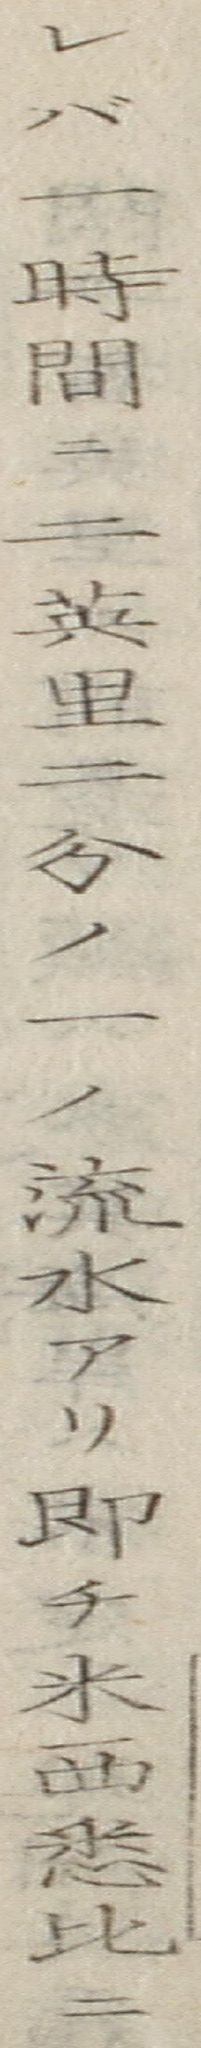レバ一時間ニ二英里二分ノ一ノ流水アリ即チ米西悉比ニ
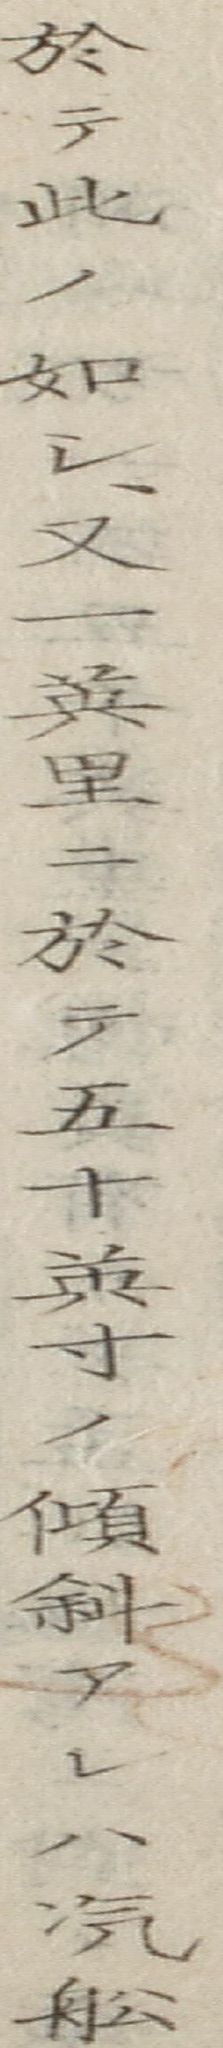於テ比ノ如シ、又一英里ニ於テ五十英寸ノ傾斜アレハ汽舩
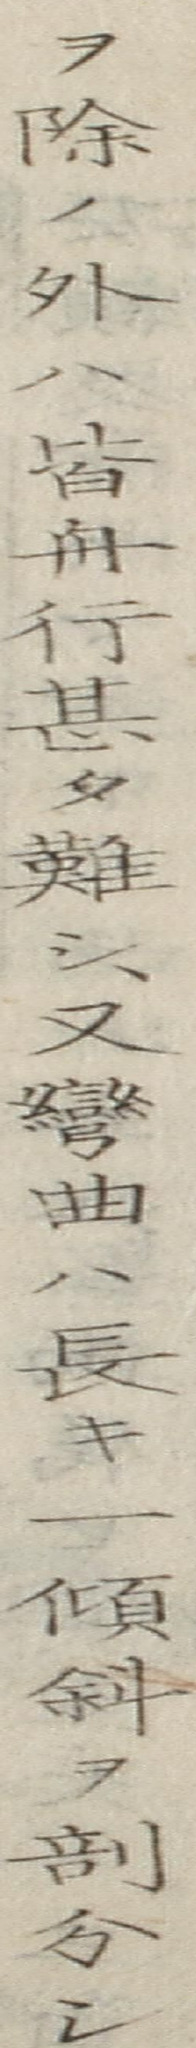ヲ除ノ外ハ皆舟行甚タ難シ、又湾曲ハ長キ一傾斜ヲ部分シ
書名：地形論　巻二
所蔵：東京大学地震研究所図書室 Earthquake Research Institute Library, The University of Tokyo, JAPAN
